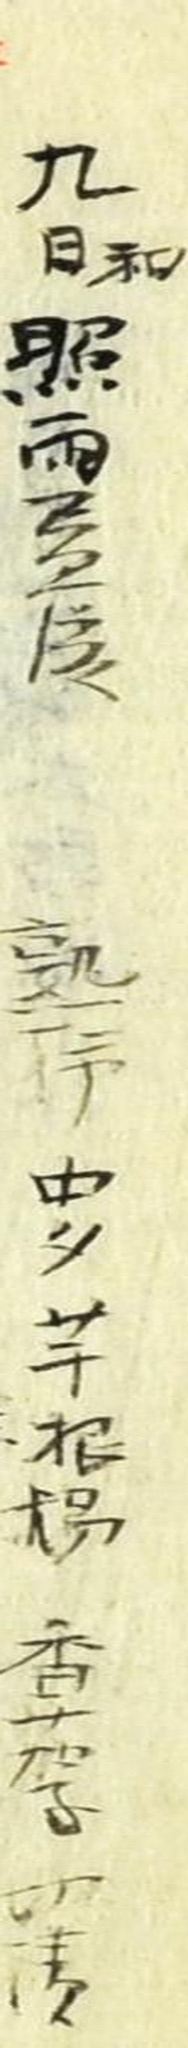九日和照雨昼後熟柿中夕芋根揚香茄子切漬
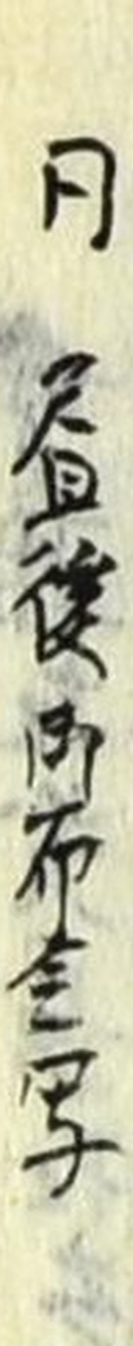同昼後御布令写
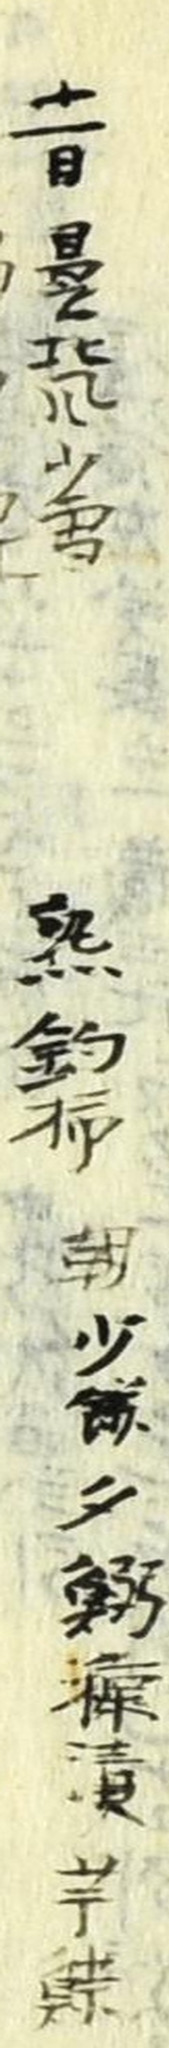十一日曇北風少雪熟釣柿朝少餅夕鰯糠漬芋鰈
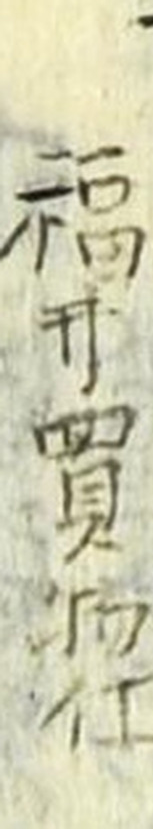福井買物仕
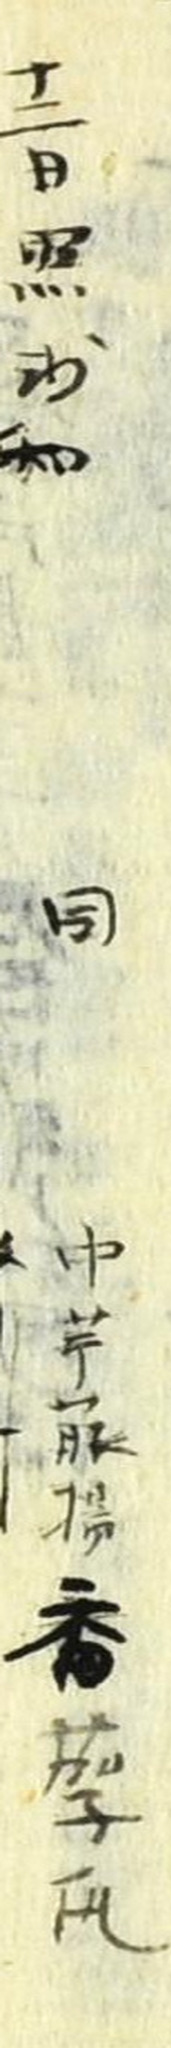十二日照氷和同中芋菔揚香茄子瓜
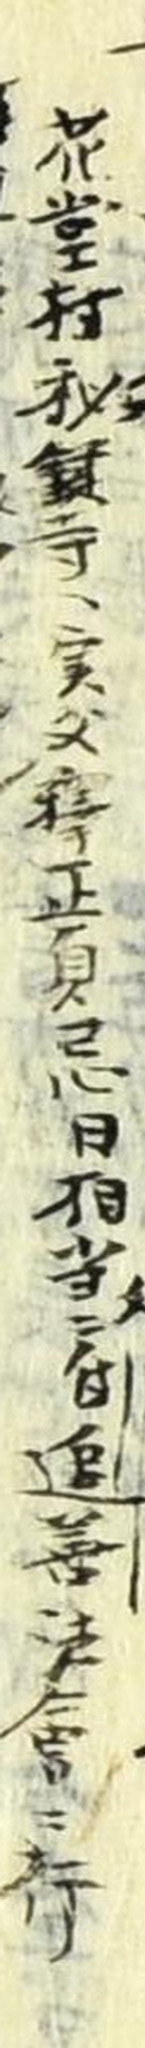花堂村秘鍵寺へ実父釈正貞忌日相当ニ付追善法会ニ行
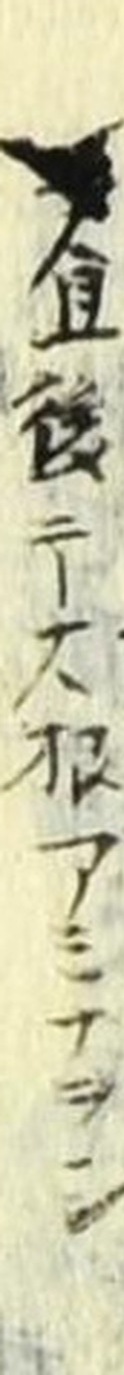昼後干大根アミナヲシ
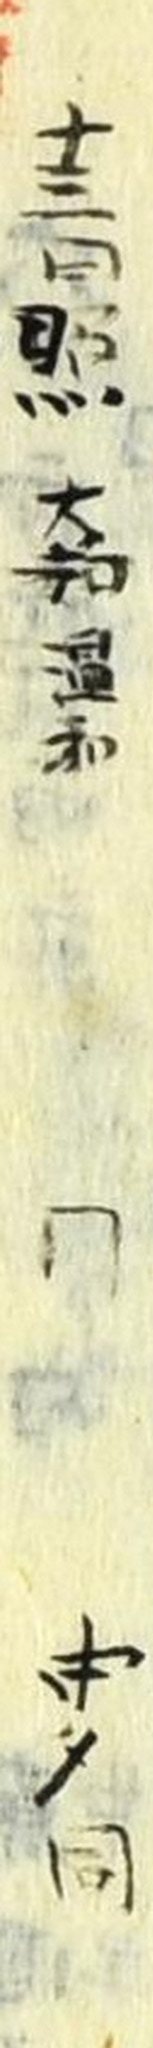十三日照大和温和同中夕同
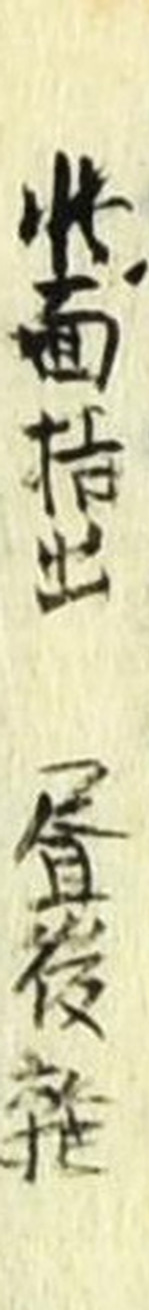帳面持出昼後雑
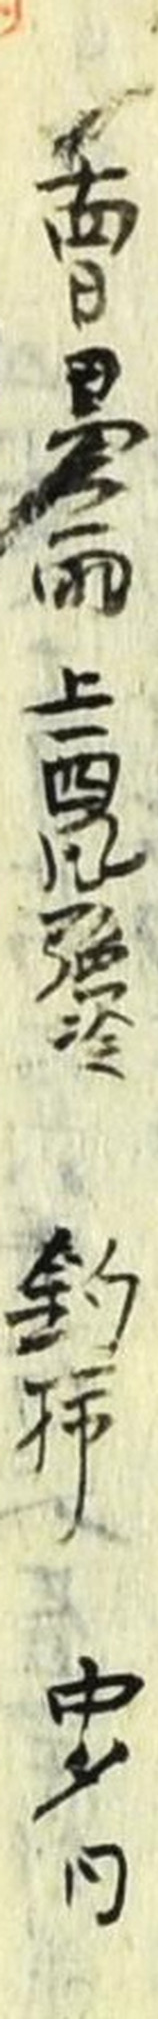十四日曇雨上西風強冷釣柿中夕同
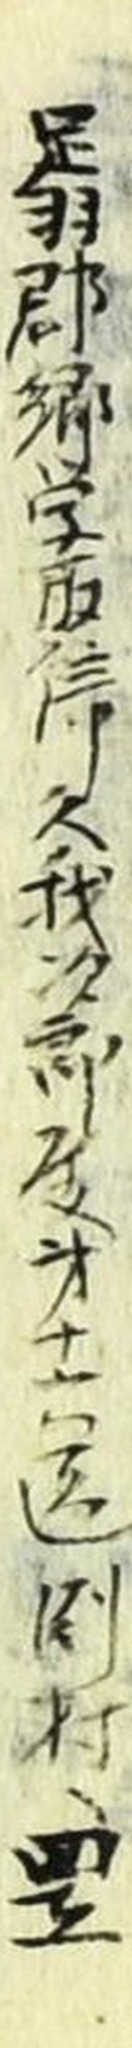足羽郡郷学取締久我次郎殿第十六区淵村へ回在
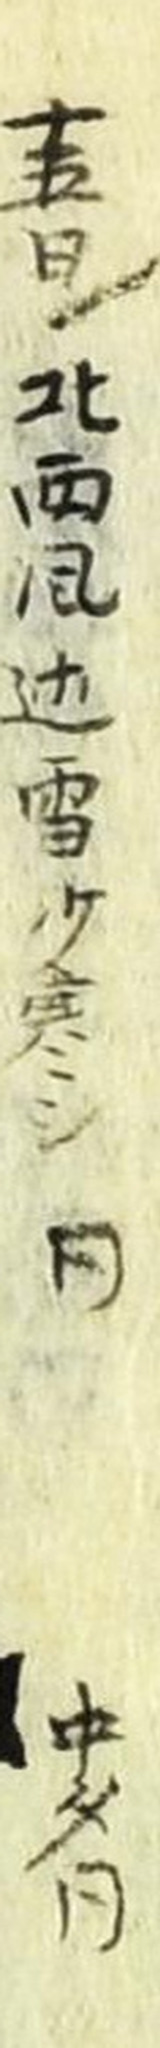十五日北西風迅雪少寒シ同中夕同
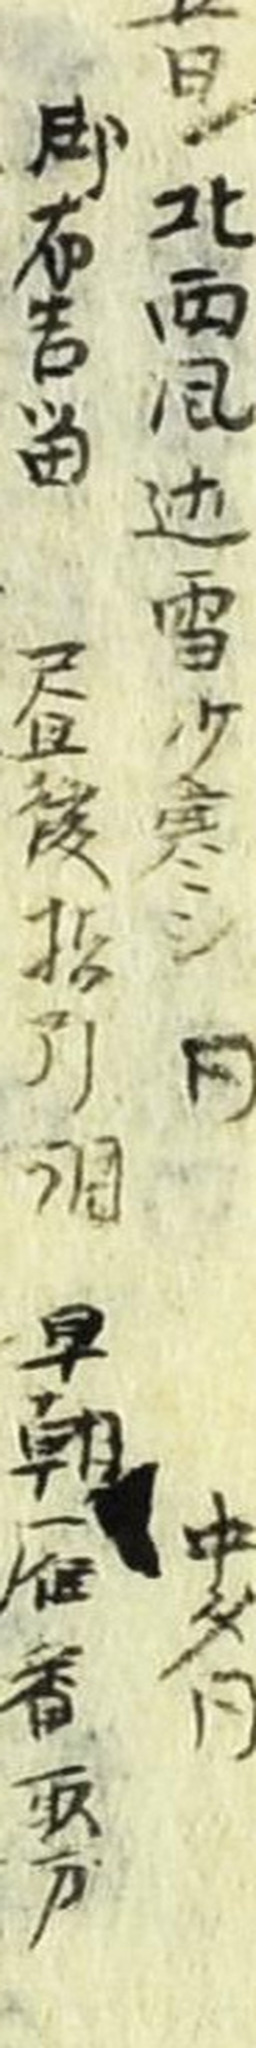御布告留昼後指引調早朝雁番取方
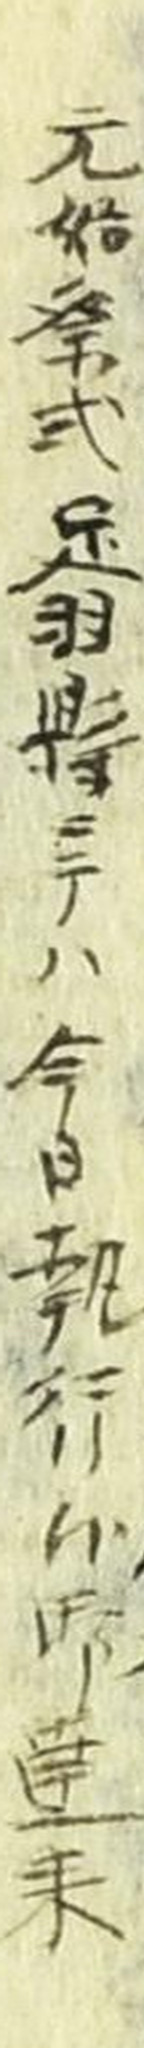元始祭式足羽県ニテハ今日執行候御達来
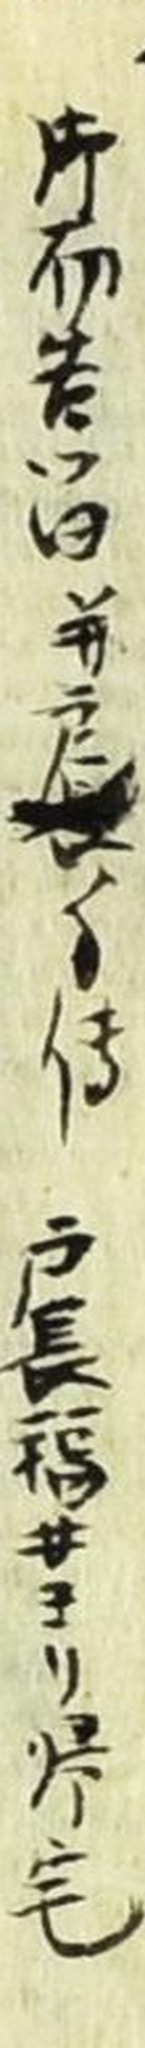御布告留幷戸長手伝戸長福井ヨリ帰宅
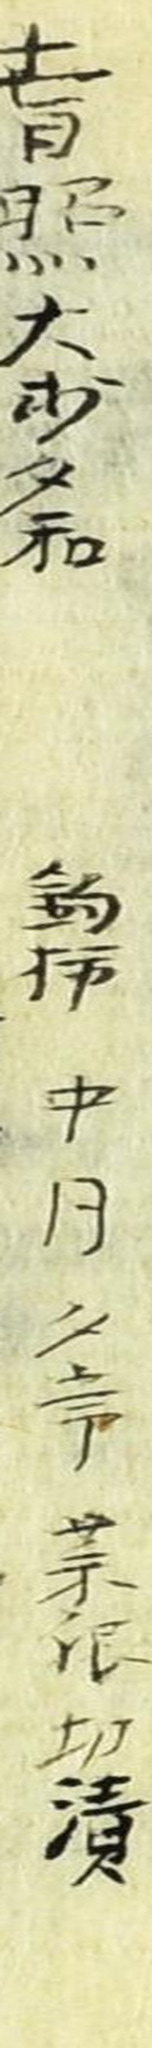十七日照大氷夕和釣柿中同夕常菜菔切漬
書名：（日記）
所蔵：福井県文書館 Fukui Prefectural Archives
